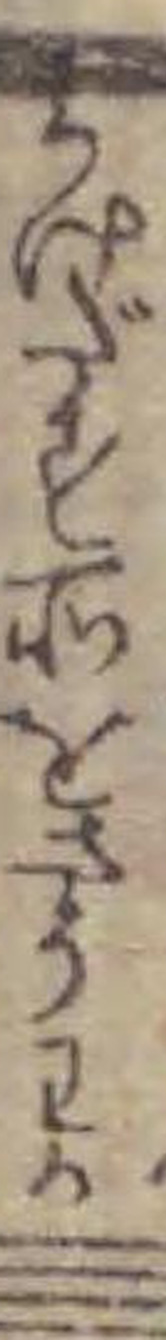かけだす所をさうわか
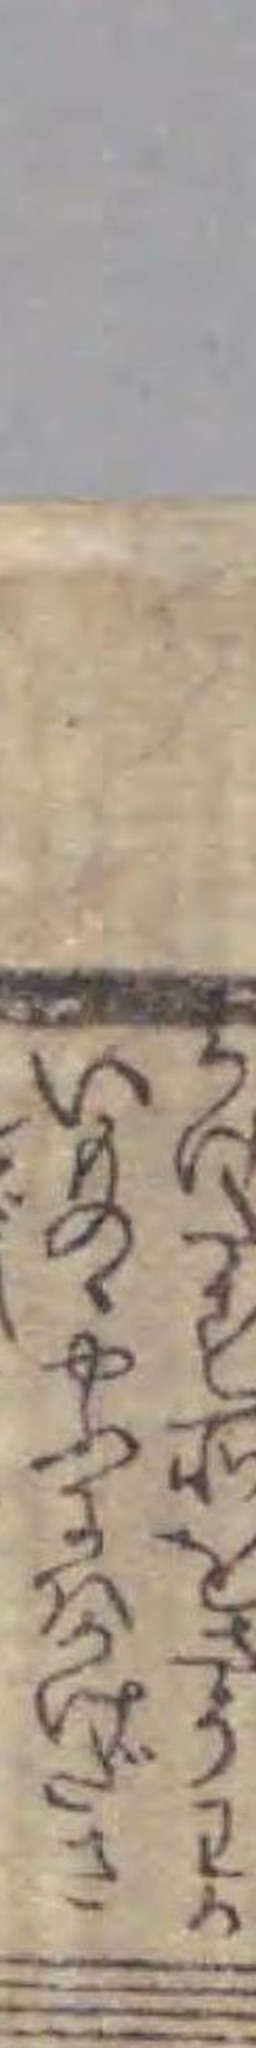いものゝやふにはかけださ
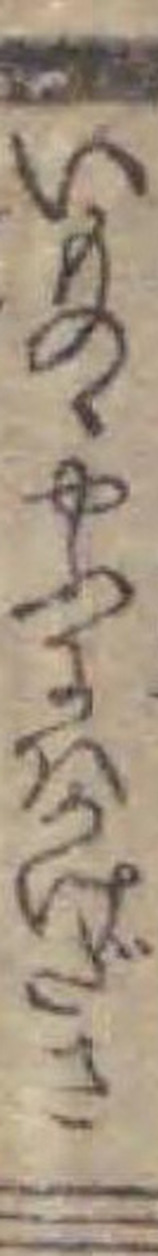いものゝやふにはかけださ
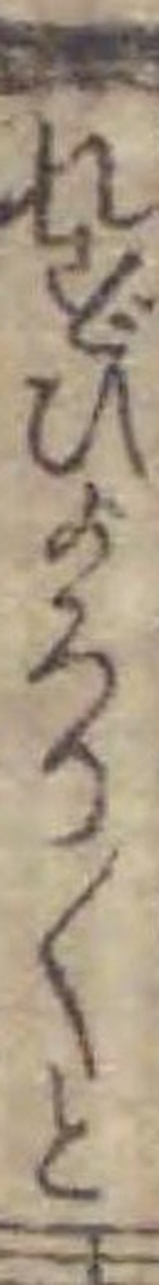れずひよろり〳〵と
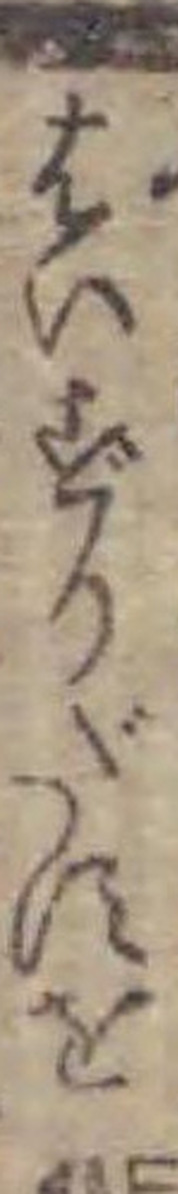はいずりだすを
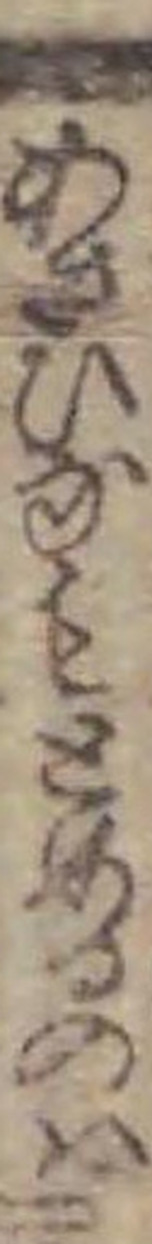めさひなもとめるのは
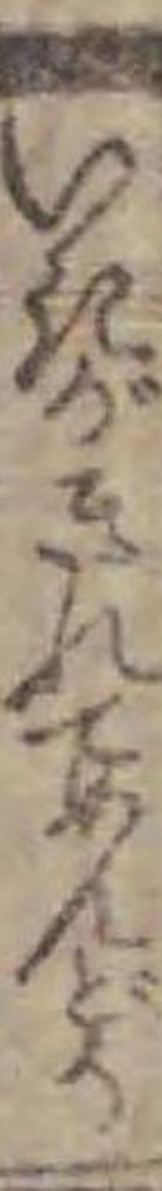いきがきれてめんどう
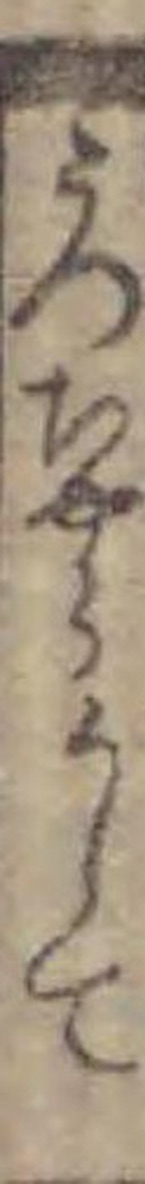うつちやらかして
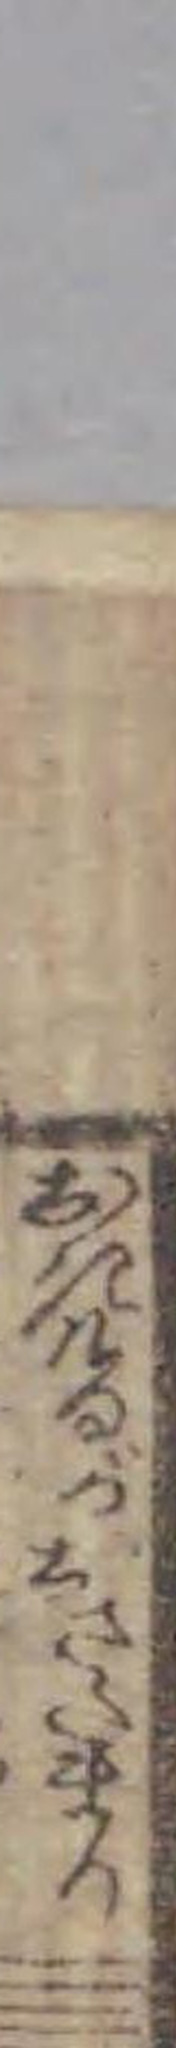おきけるがおさたまり
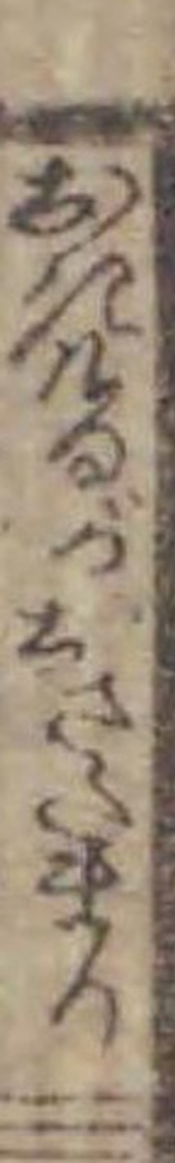おきけるがおさたまり
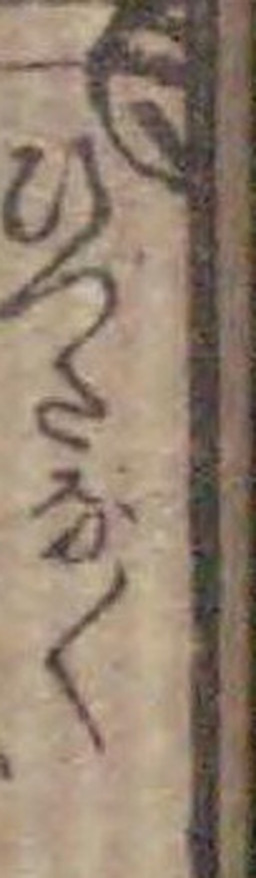ひつたな〳〵
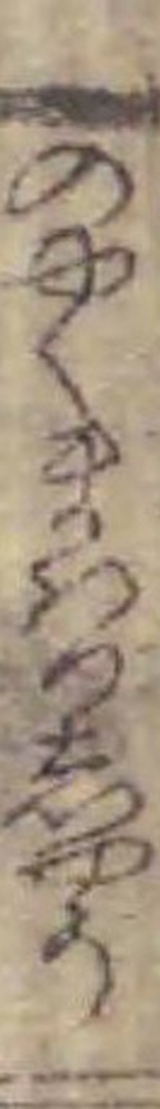のやくまはりしやう
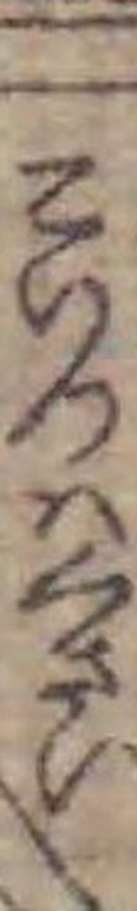こいつはくさい
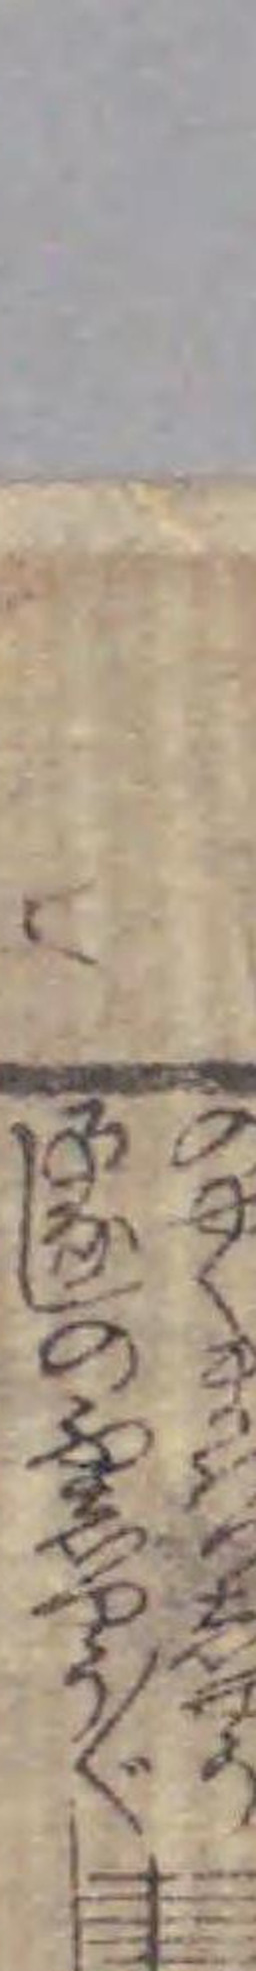事なしのふしやう〴〵
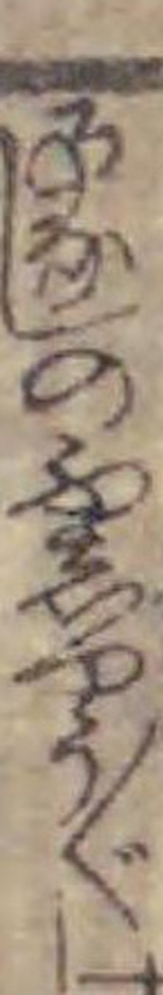事なしのふしやう〴〵
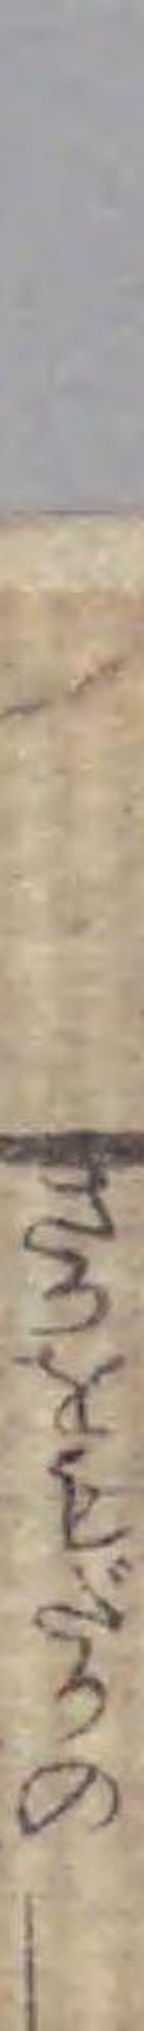さかをもだかの
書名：年寄之冷水曽我 : 3巻
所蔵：国立国会図書館 National Diet Library, JAPAN
